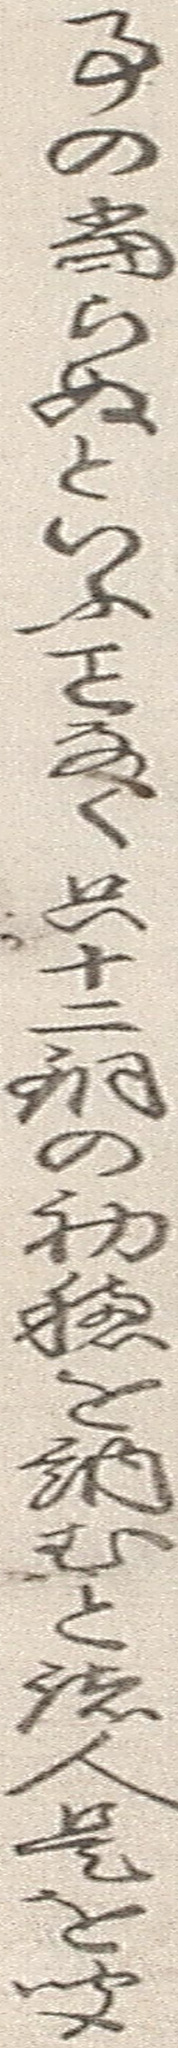事の当らぬといふことなく只十二銅の初穂を納むと諸人是を聞
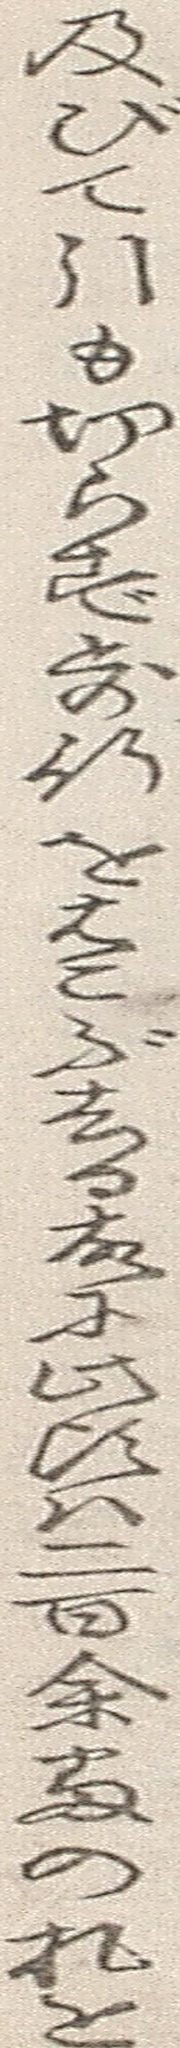及びて引も切らず歩行をはこぶ去る故に此頃ハ二百余番の札を
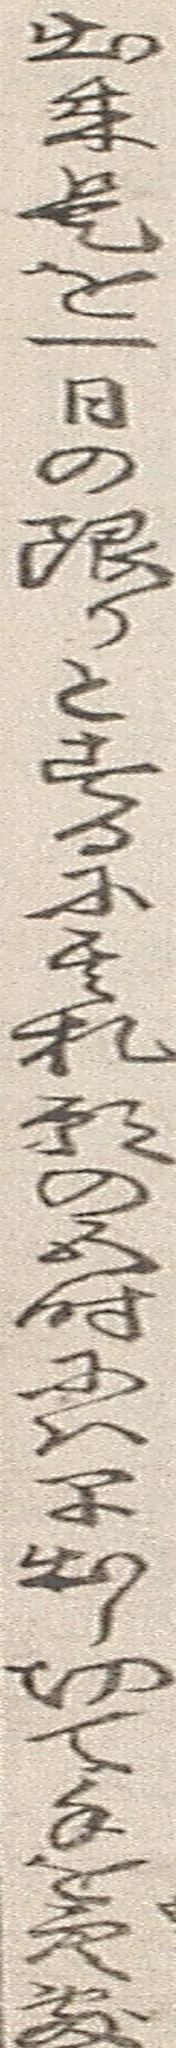出来是を一日の限りとするに其札朝の五時にハ早出し切て手を空敷
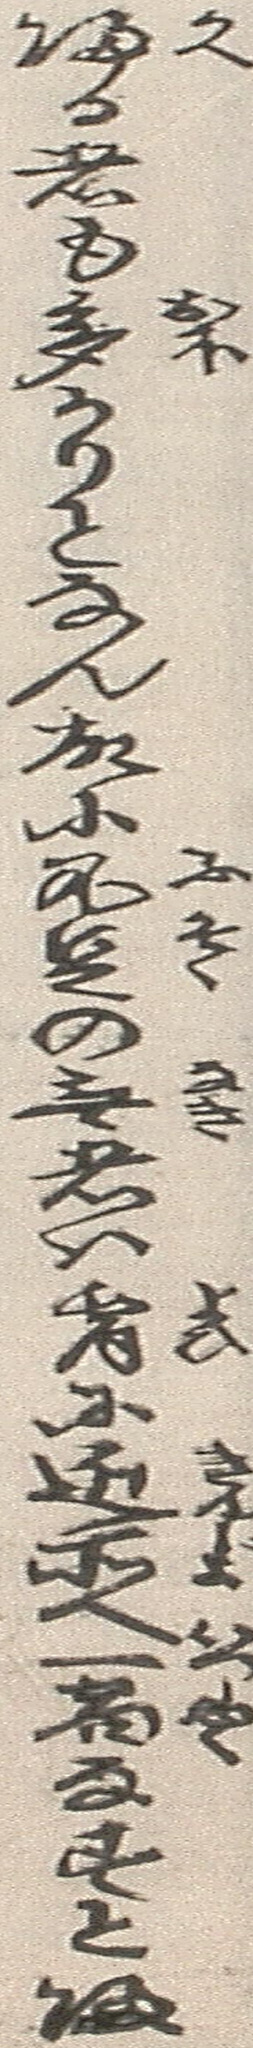帰る者も多かりとなん故に不足の無者ハ宵に近所へ一宿なすと帰
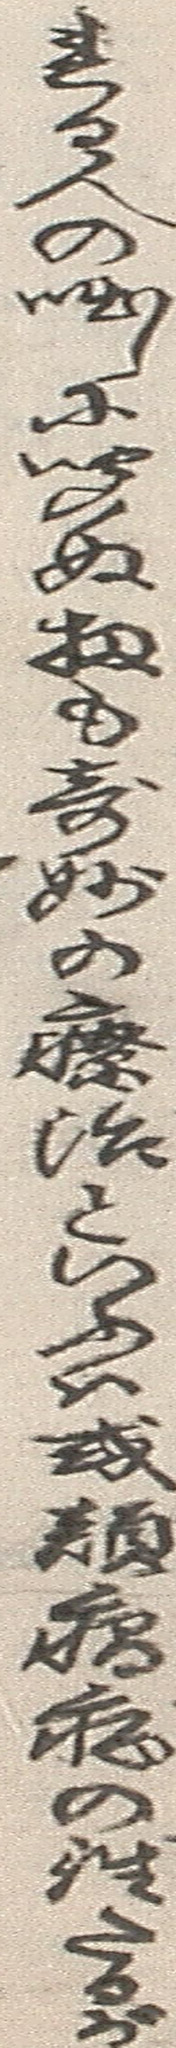れる人の咄しに聞ぬ扨も奇妙の療治といふハ或顛癇病の往たるが
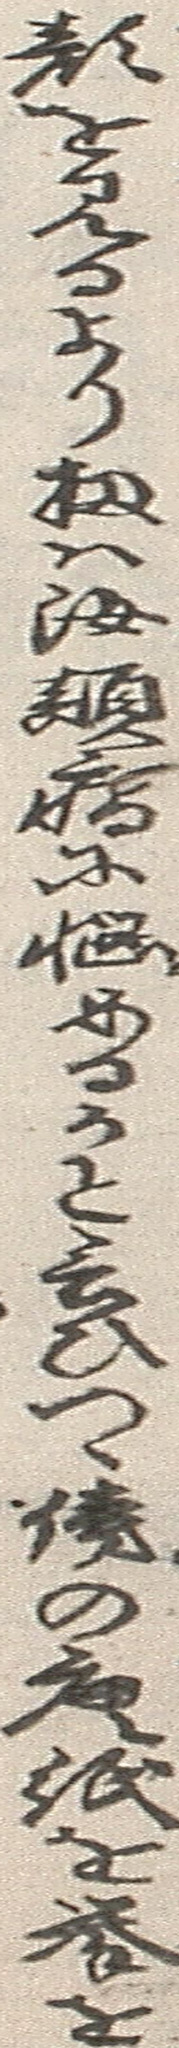顔を見るより扨ハ汝顛癇に悩めるかと言ひつゝ傍の唐紙を拳を
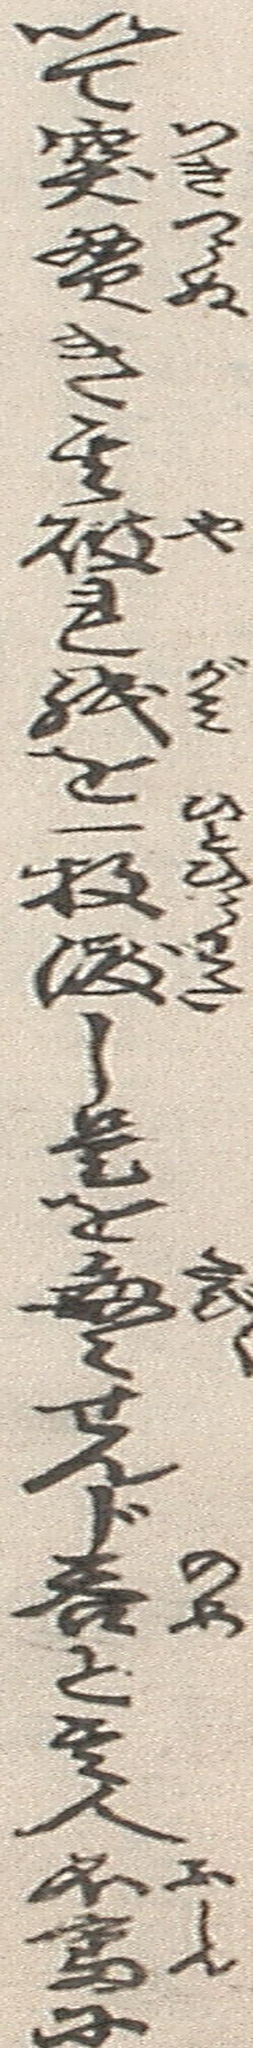以て突貫き其破れ紙を一枚渡し是を毎々せんじ呑と其人不審に
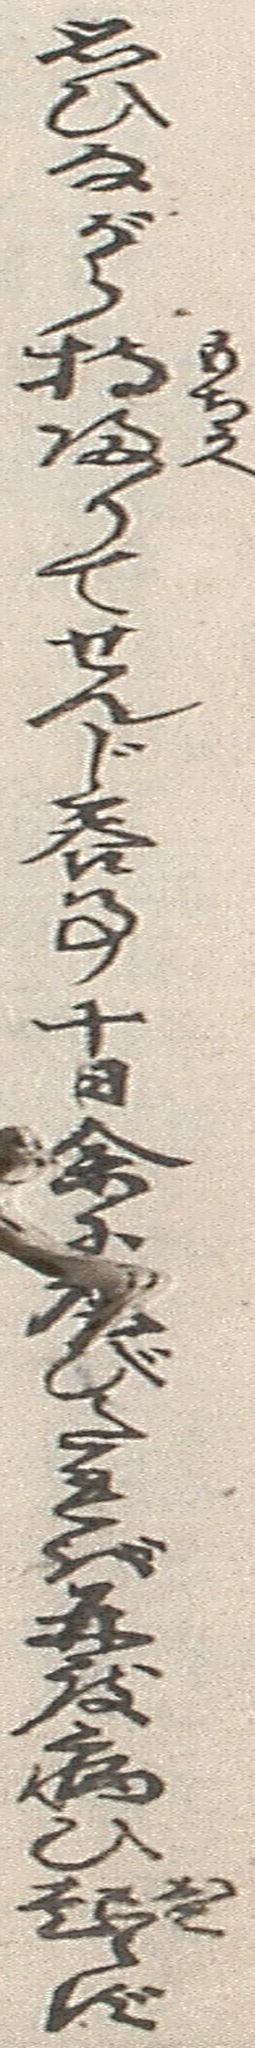思ひながら持帰りてせんじ呑事十日余に及びたれバ再度病ひ起らず
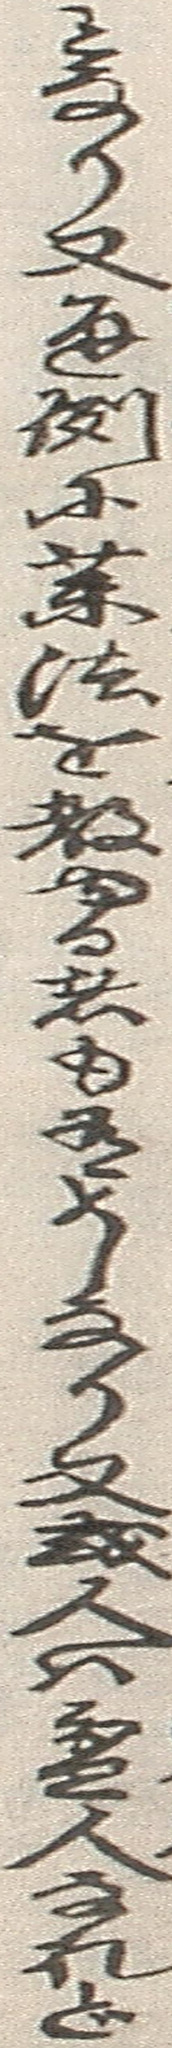となり又通例に薬法を教ゆる者も有よしなり又或人ハ貧人なれど
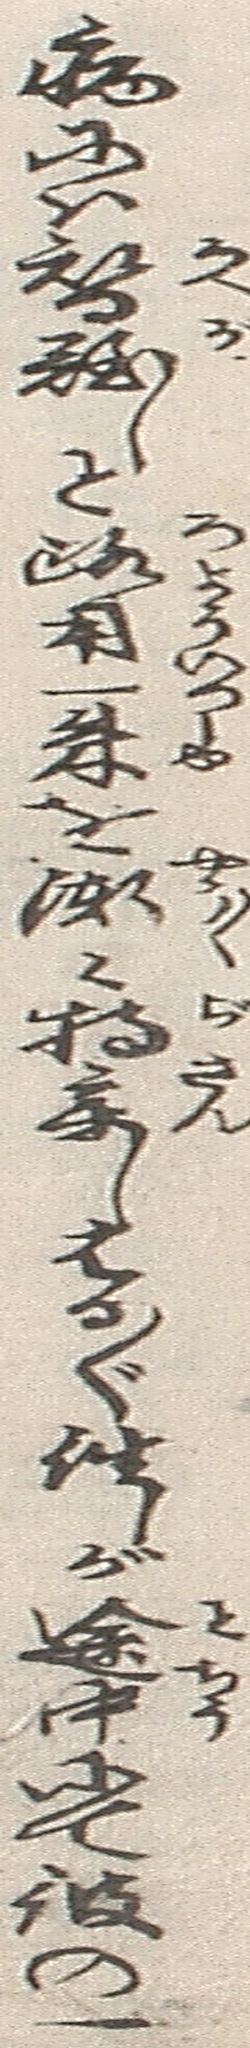病にハ替難しと路用一朱を漸々持参しはる〴〵往しが途中にて彼の一
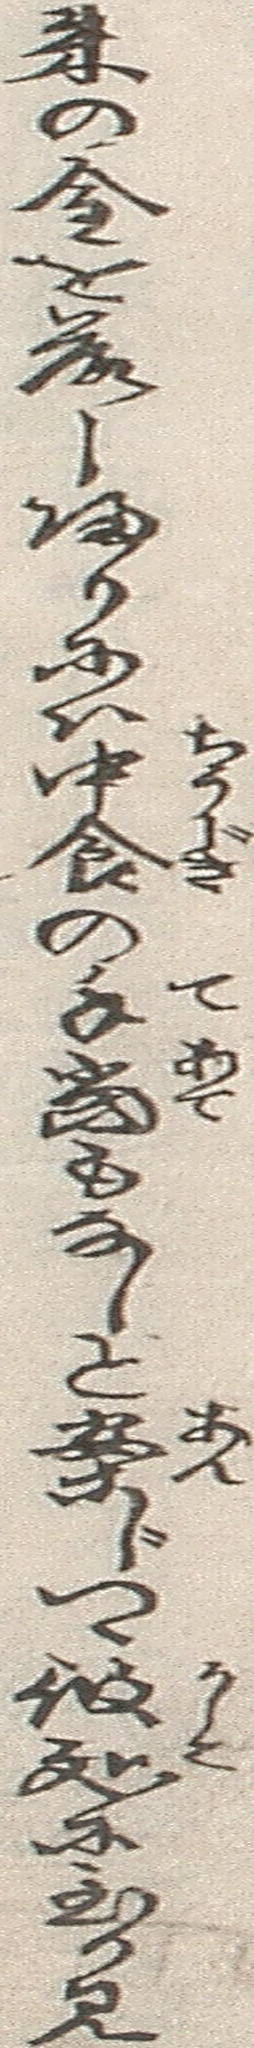朱の金を落し帰りにハ中食の手当もなしと案じつゝ彼処に至り見
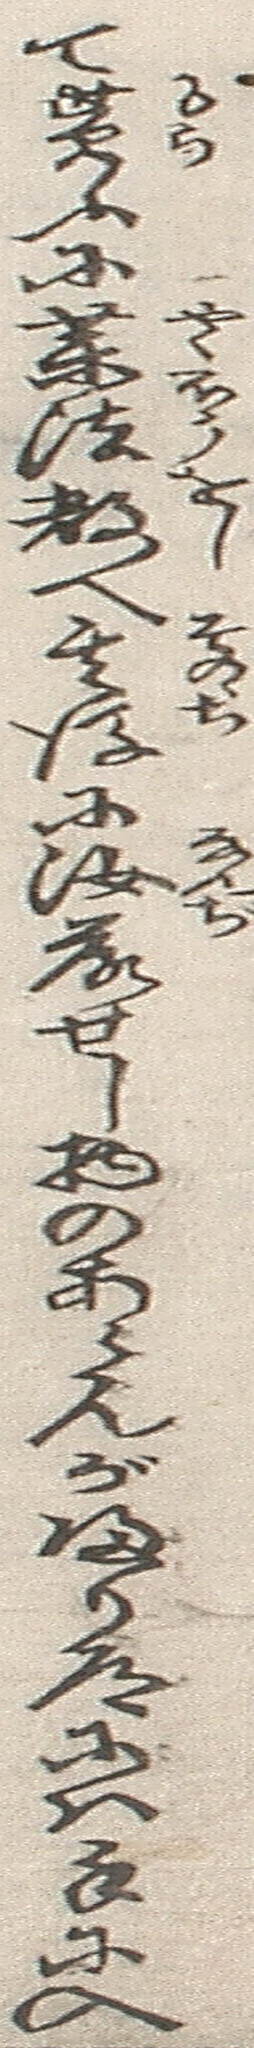て貰ふに薬法教へ其後に汝落せし物のあらんが帰り道にハ手に入
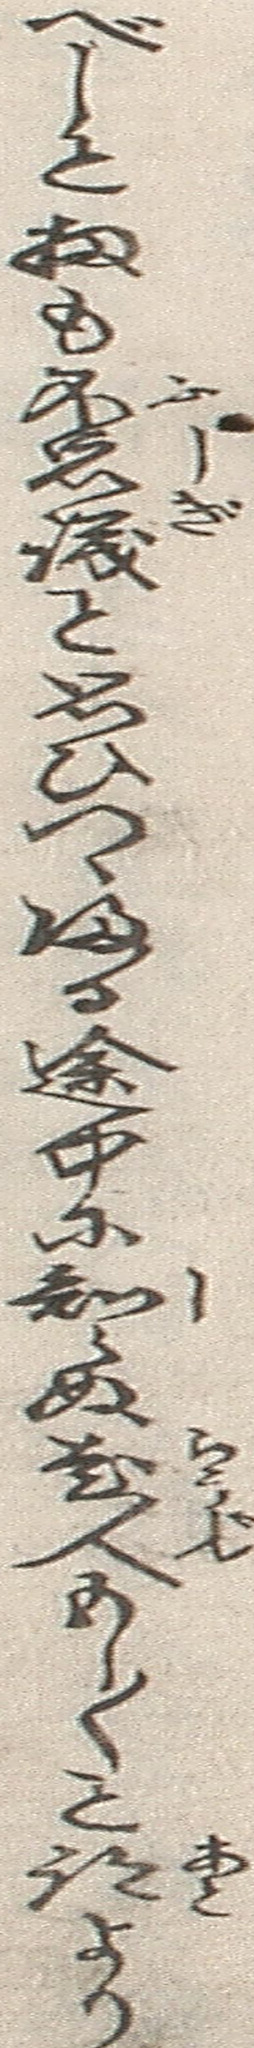べしと扨も不思議と思ひつゝ帰る途中に知らぬ老人もし〳〵と跡より
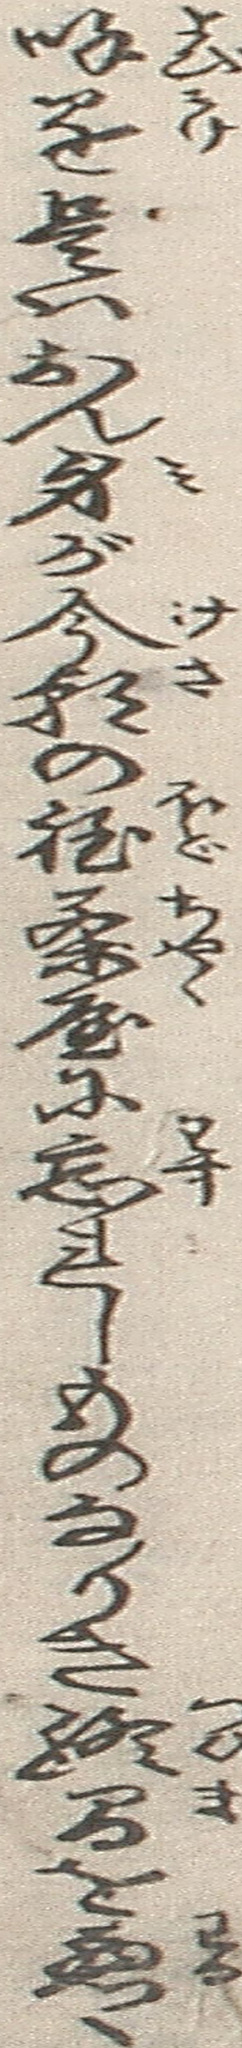呼懸是ハおん身が今朝の程茶屋に忘れしものなりき終間を悪く

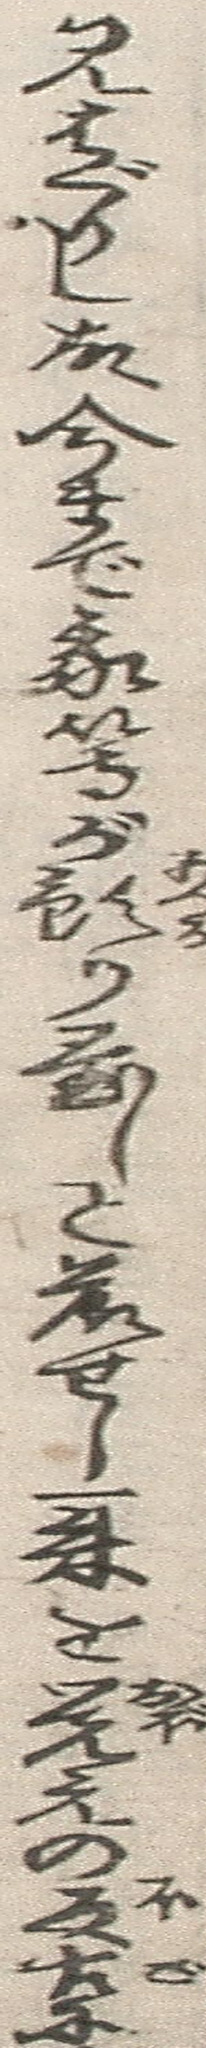見はぐりし故今まで我等が預り置しと落せし一朱を覚えの反古に
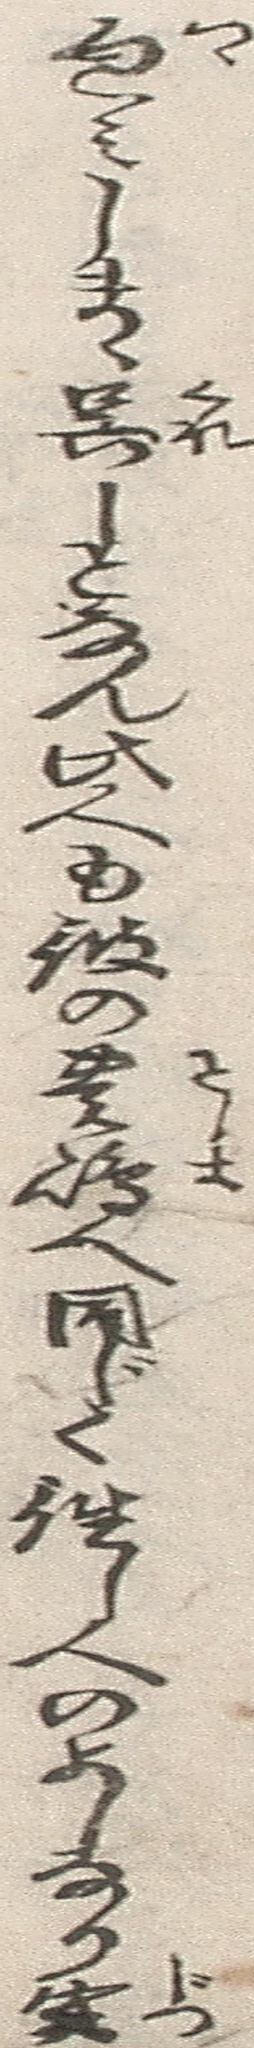包ミしまゝ呉しとなん此人も彼の豊島へ同じく往し人のよしなり実
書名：安政風聞集　上中下　全
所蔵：東京大学地震研究所図書室 Earthquake Research Institute Library, The University of Tokyo, JAPAN
